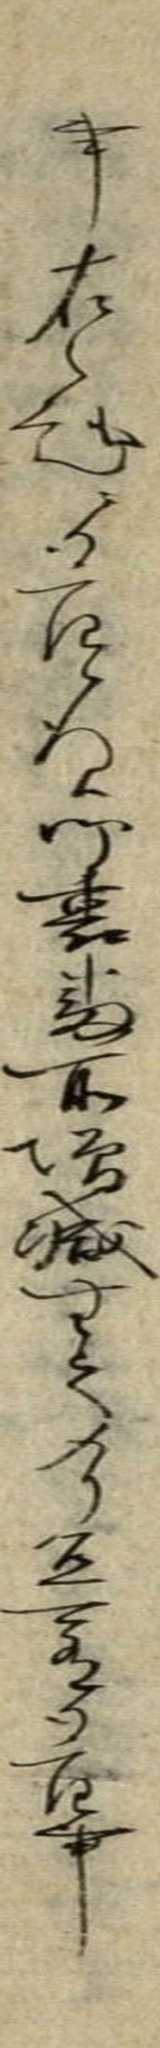事右之趣に御座候得は御裏番所増減無之〆り宜可有御座候事
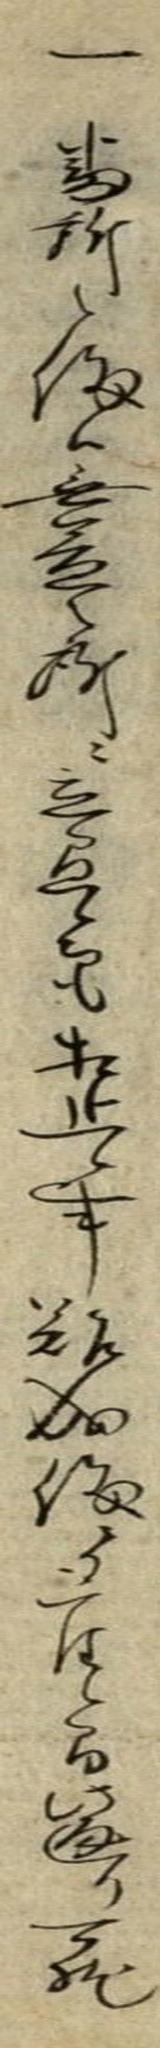一番所之儀は無益之所に立置候ても相止候事難成儀に御座候間此通り可然
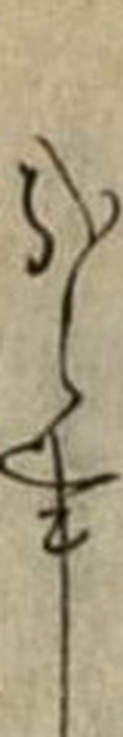哉之事
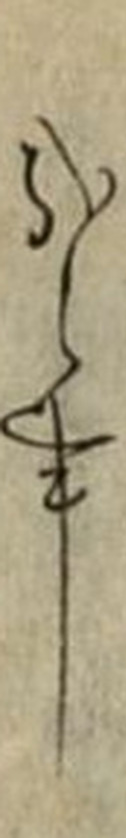哉之事
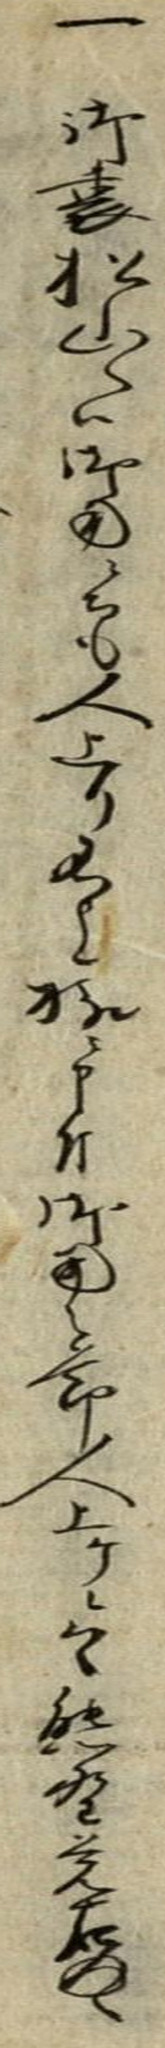一御裏松山へは御用にても人上り不申様に申付御用之節人上け候はゝ熊野覚右衛門へ
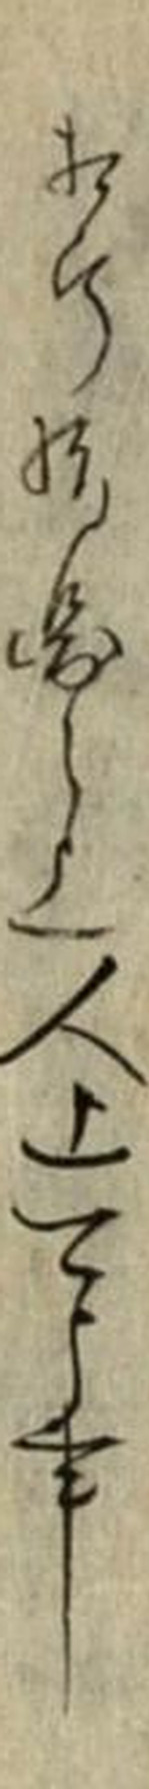相断指図之上人上可申事
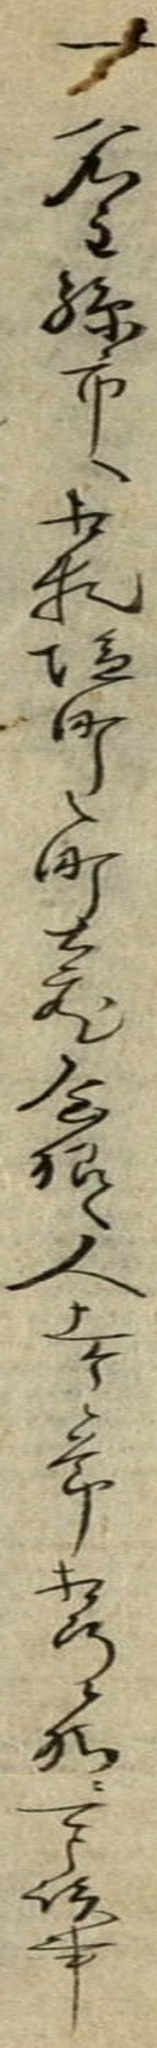一名主孫市へ相頼塩町之町土蔵屋根へ人上け候節相断候様に可申談事
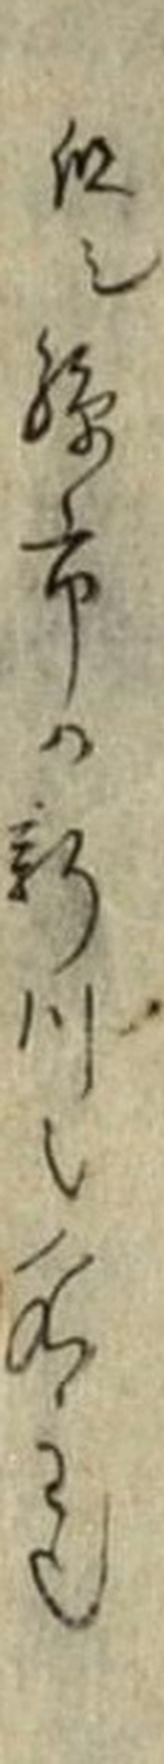但し孫市は新川之名主也
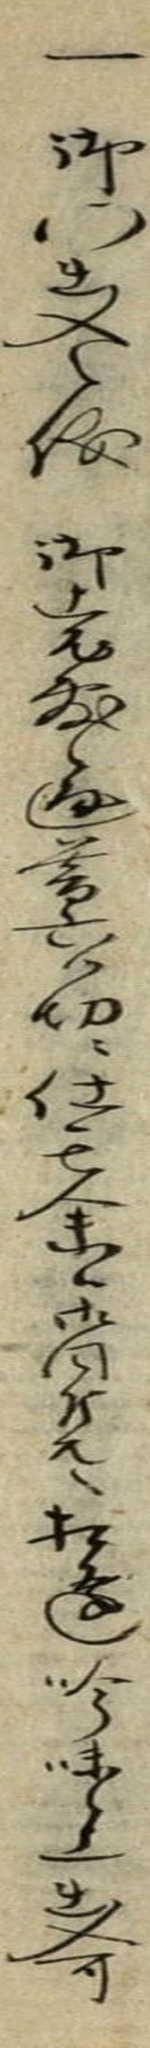一御門出入之儀御上屋敷之通暮六ツ切に仕其余は御目付共へ相達吟味之上出入可
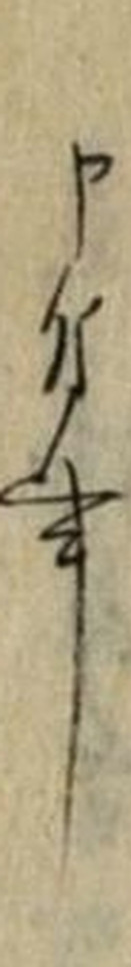申付事
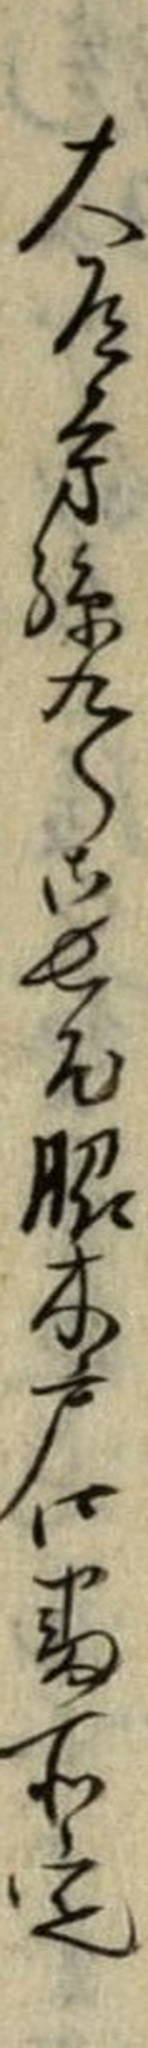大道寺孫九郎御長屋脇木戸御番所定
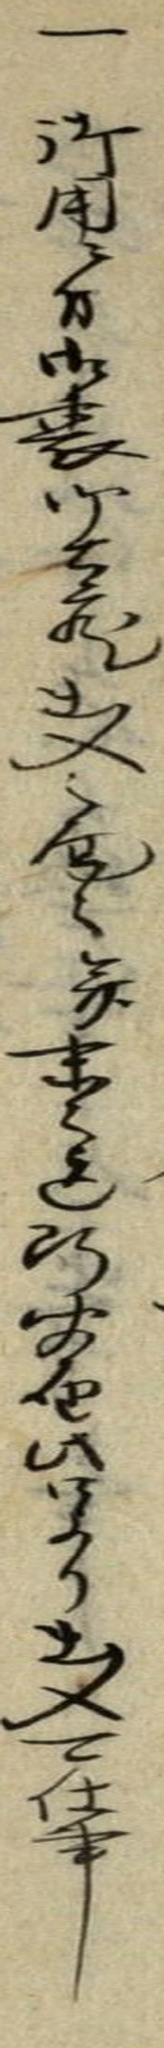一御用に付御裏御土蔵出入之面々幷末々迄断聞届此口より出入可仕事
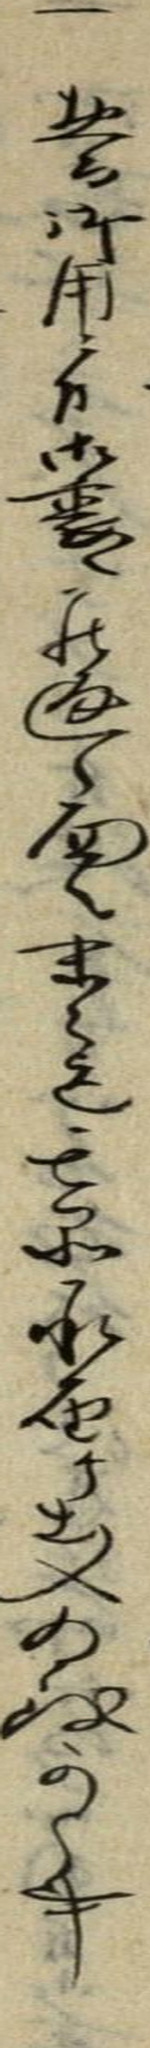一惣て御用に付御裏へ罷通候面々末々迄其品承届け出入為致可申事
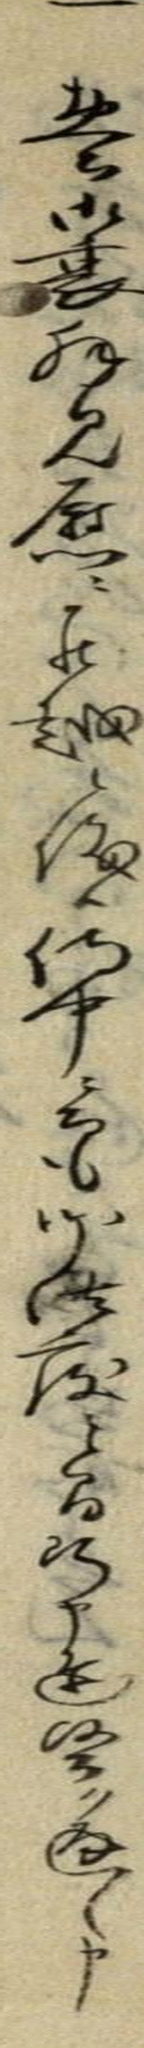一惣て御裏拝見慰に罷越候儀は侍中にても御法度に候間断申達堅く通し申
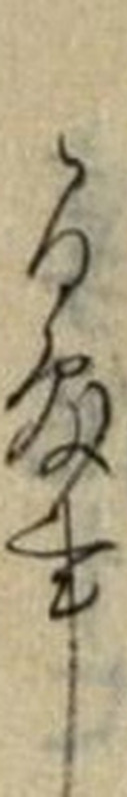間敷事
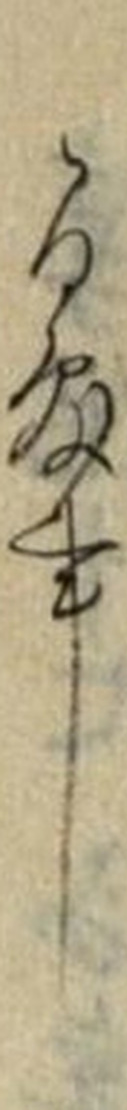間敷事
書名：三都并道中之部
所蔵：福井県文書館 Fukui Prefectural Archives
